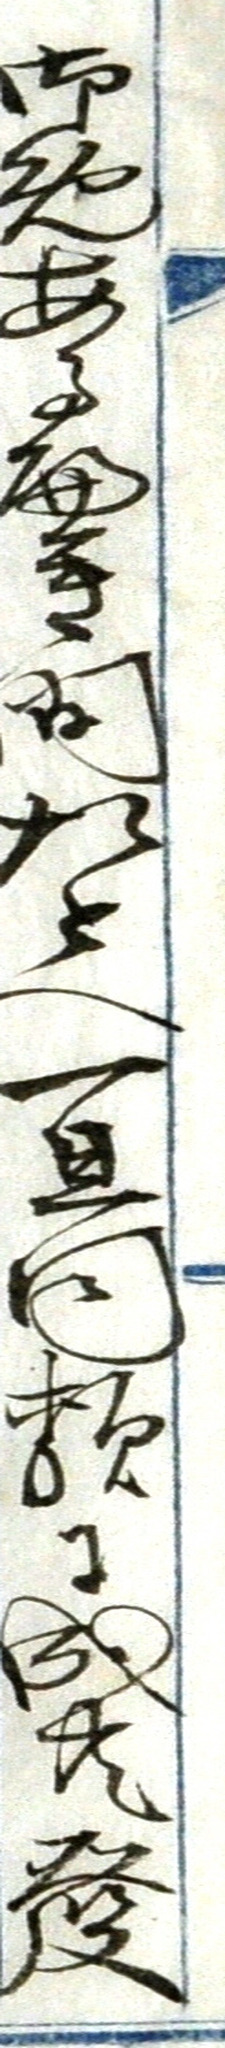御免あるべき間たとへ一旦同類に成共発
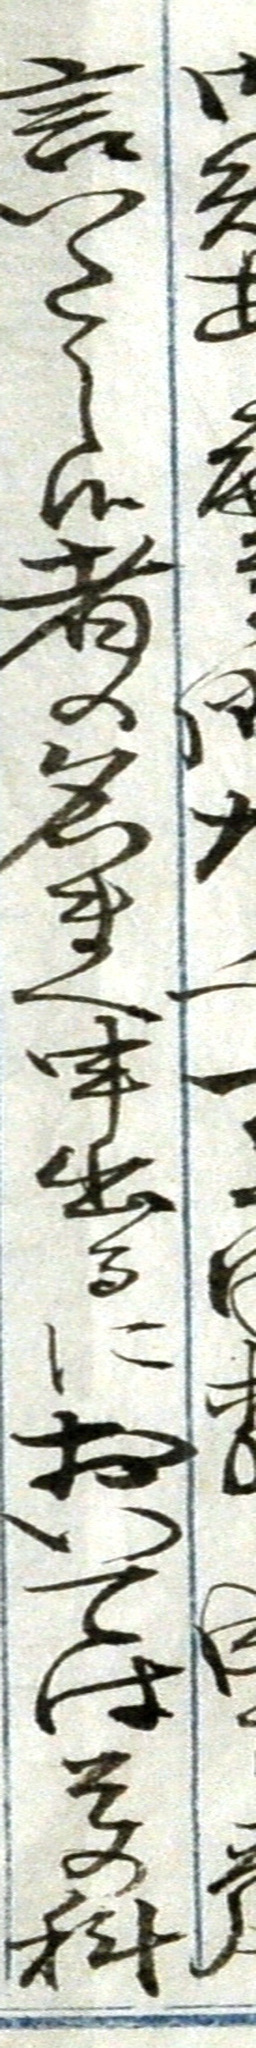言いたし候者の名まへ申出るにおいてはその科
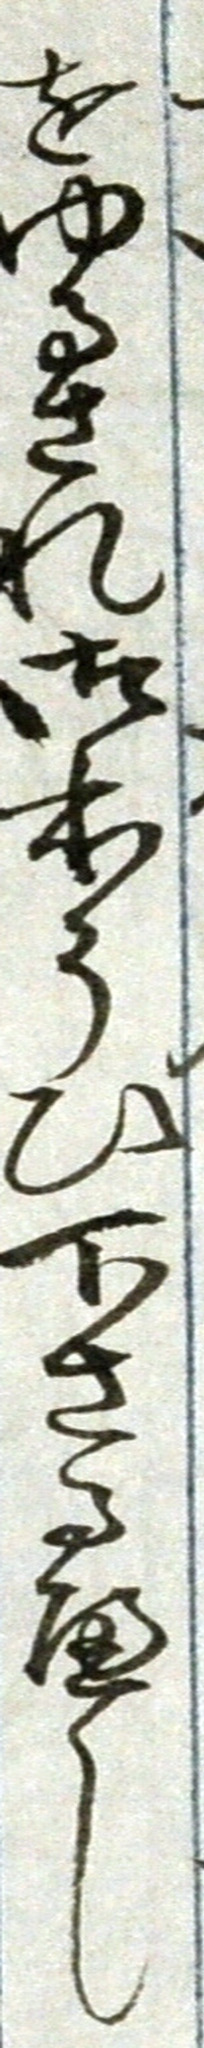をゆるされ御ほうひ下さるへし
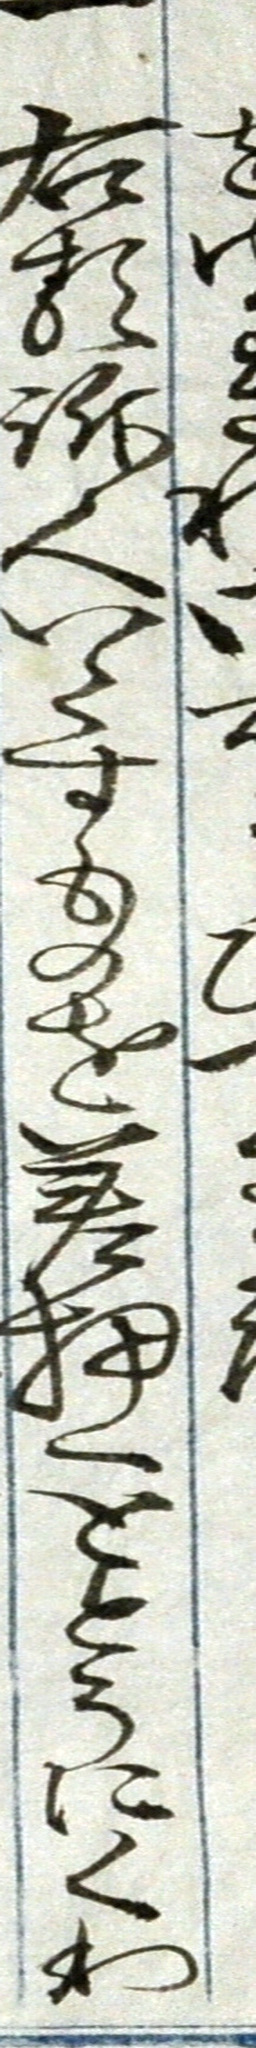一右類訴人いたすものを差押へととうにくわ
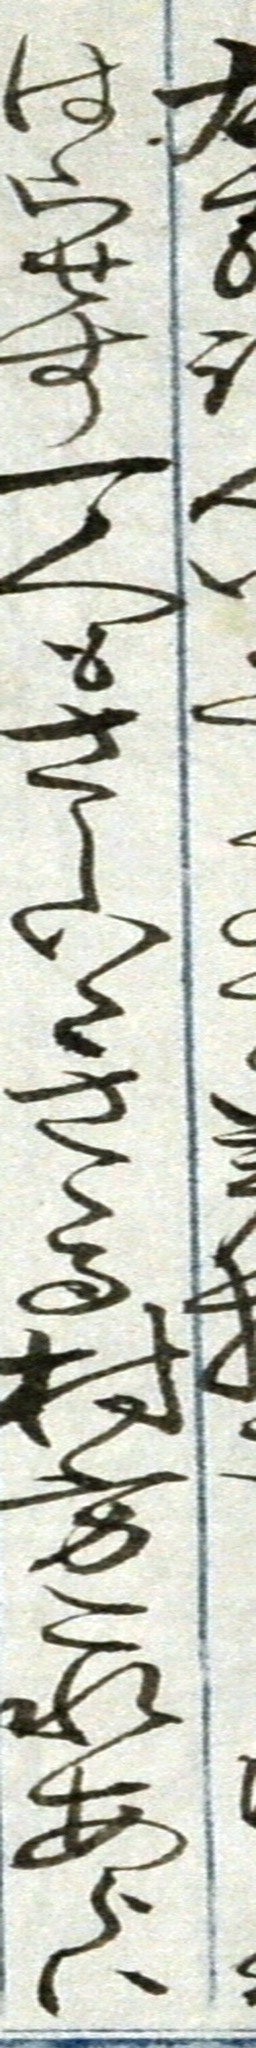はらせす一人もさしいたさゝる村方これあらは
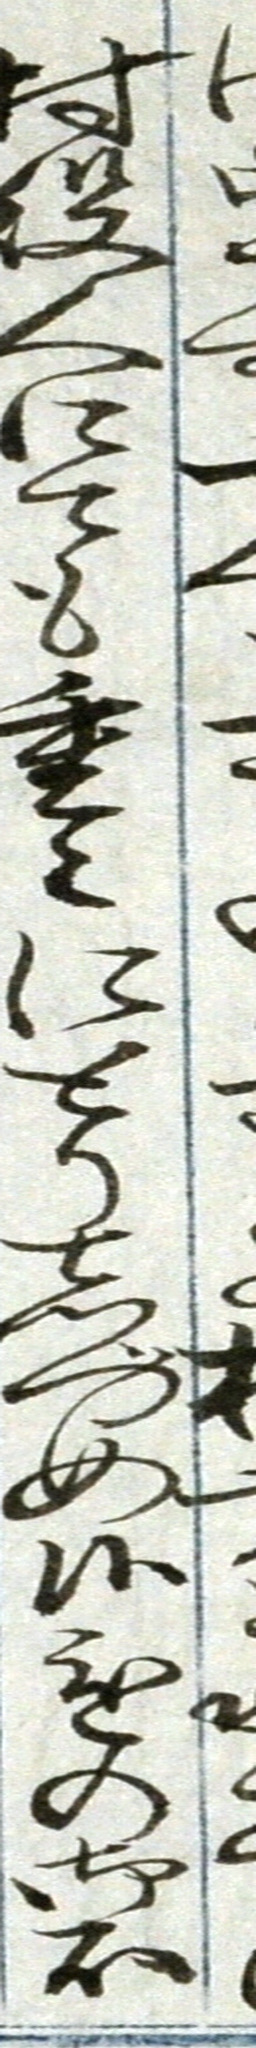村役人にても重々にとりしづめ候もの御ほ
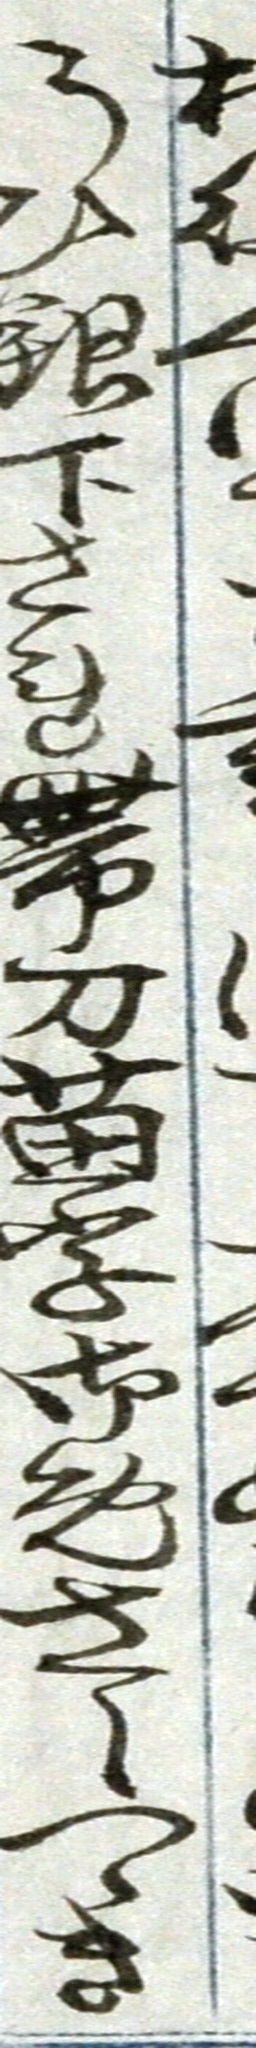うひ銀下され帯刀苗字御免さしつゝき
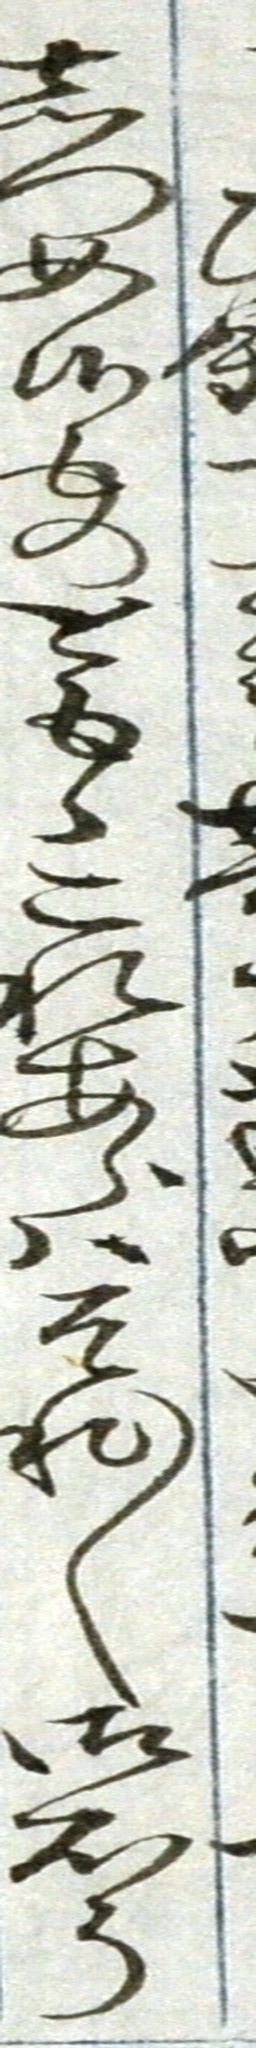しつめ候ものともゝこれあらはそれ〳〵御ほう
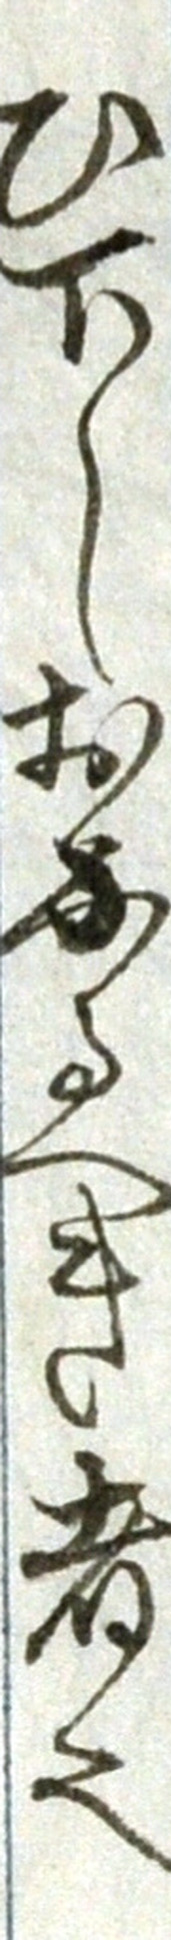ひ下しおかるへき者也
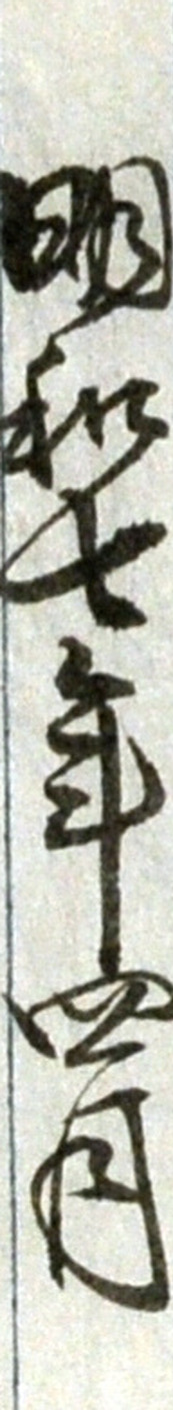明和七年四月奉行
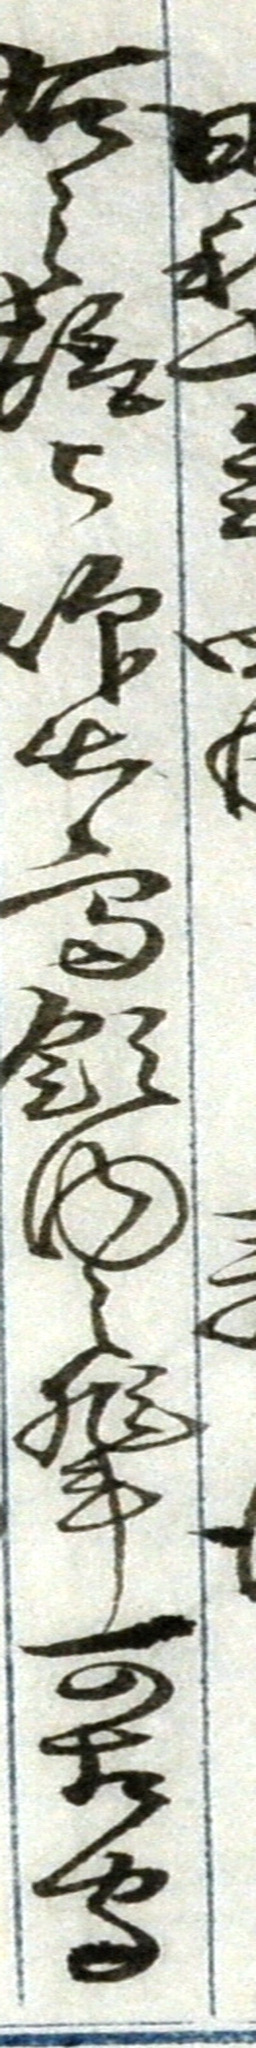右之趣被仰出候間領内之輩可相守
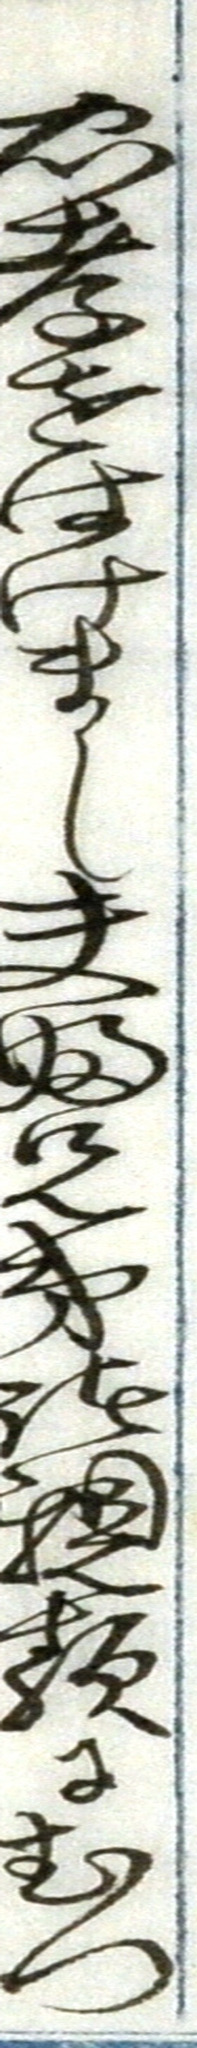一忠孝をはけまし夫婦兄弟諸親類にむつ
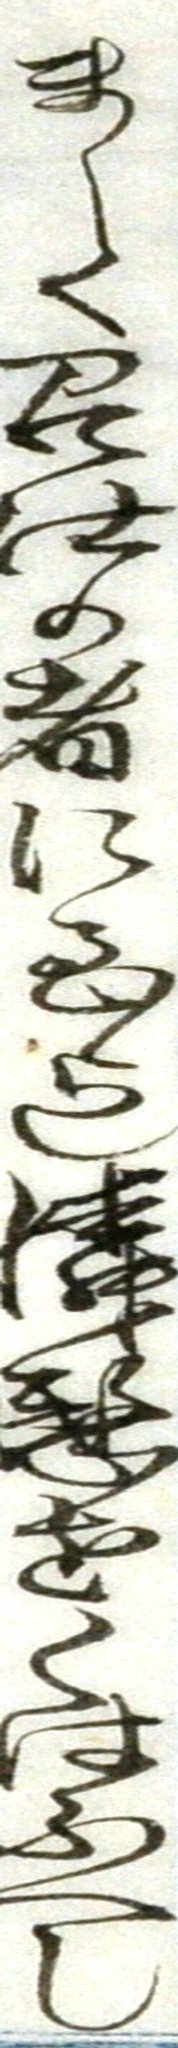ましく召仕の者に至迄憐愍をくはふへし
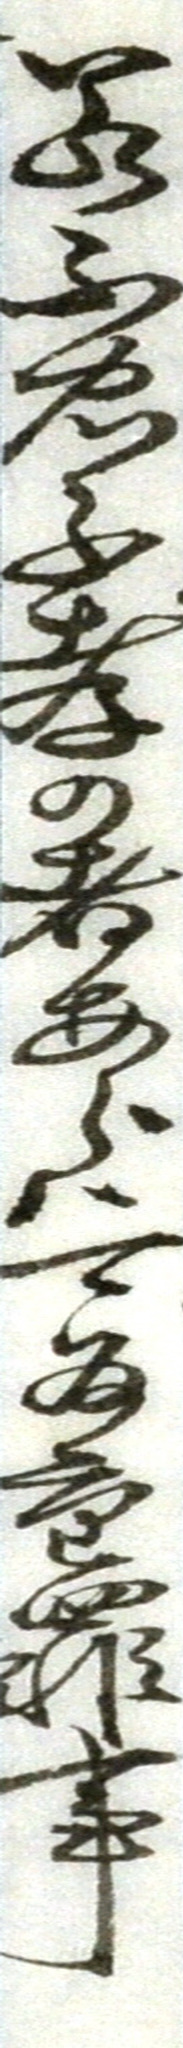若不忠不孝の者あらは可為重罪事
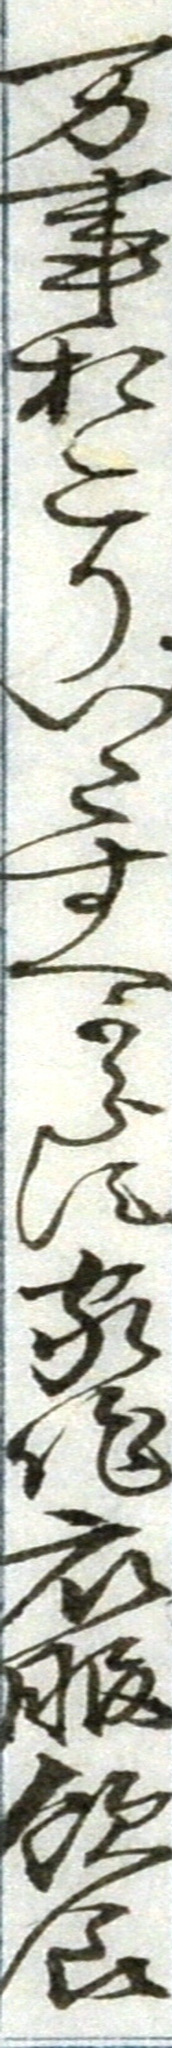一万事おこりいたすへからす家作衣服飲食
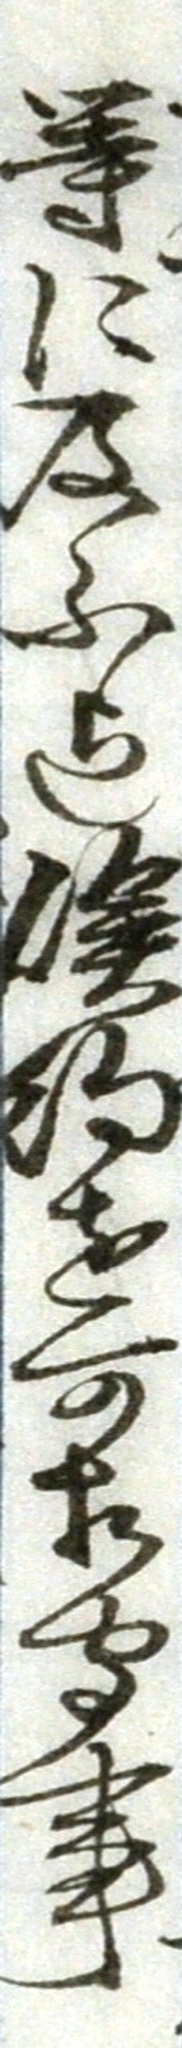等に及ふ迄倹約を可相守事
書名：御高札之写
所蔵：伊那市立高遠町図書館・合同会社AMANE
